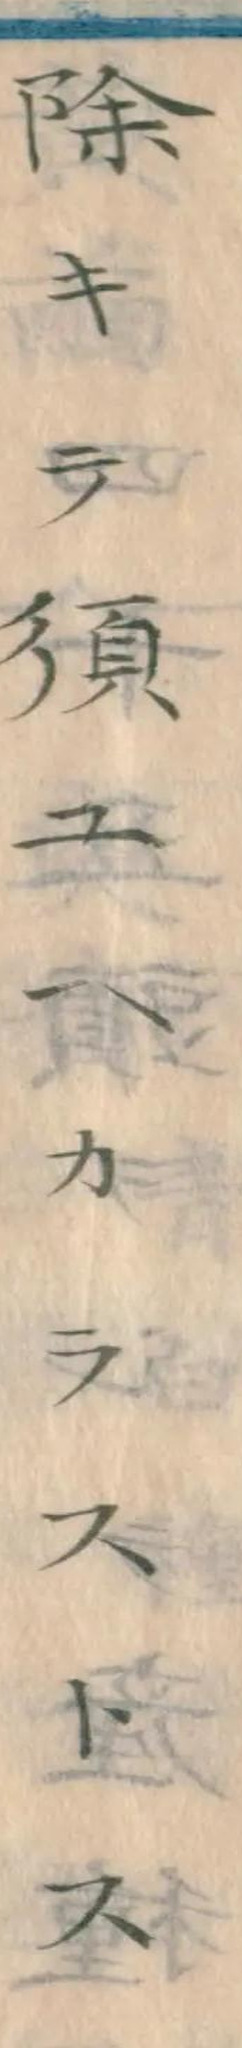除キテ須ユヘカラストス
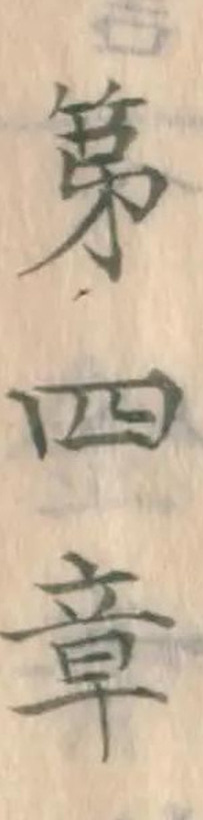第四章
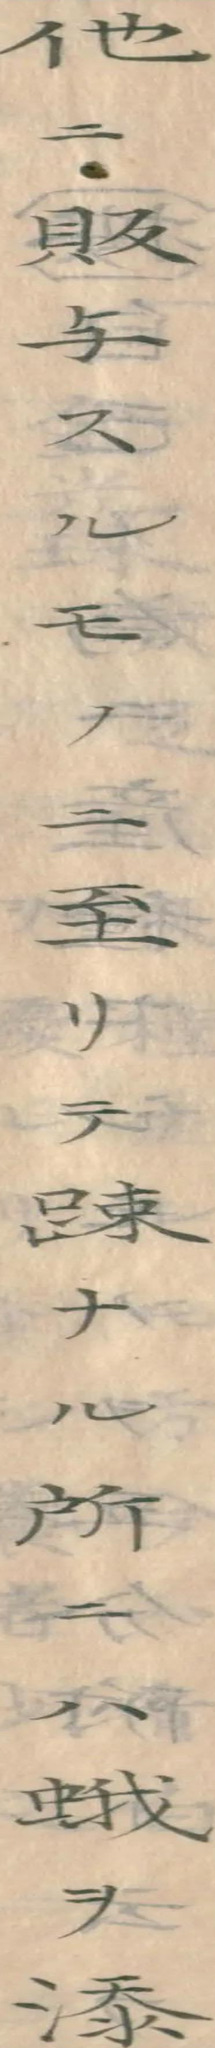他ニ販与スルモノニ至リテ疎ナル所ニハ蛾ヲ添
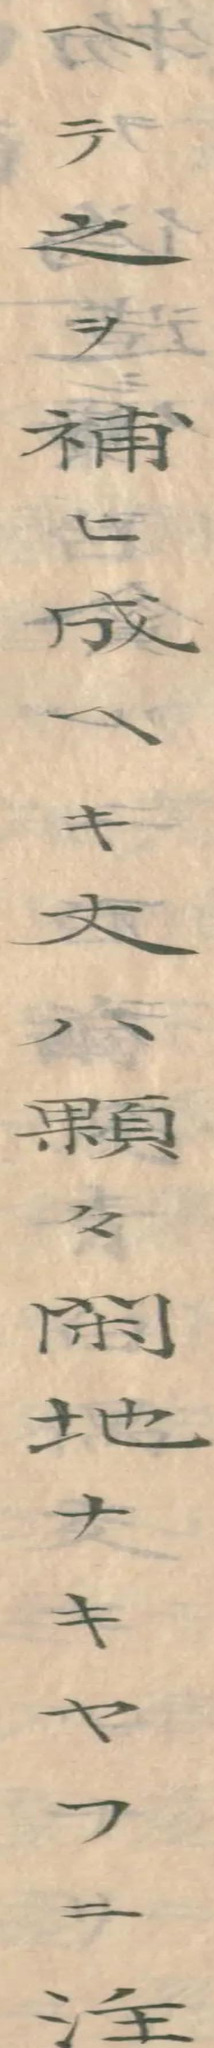ヘテ之ヲ補ヒ成ヘキ丈ハ顆々閑地ナキヤフニ注
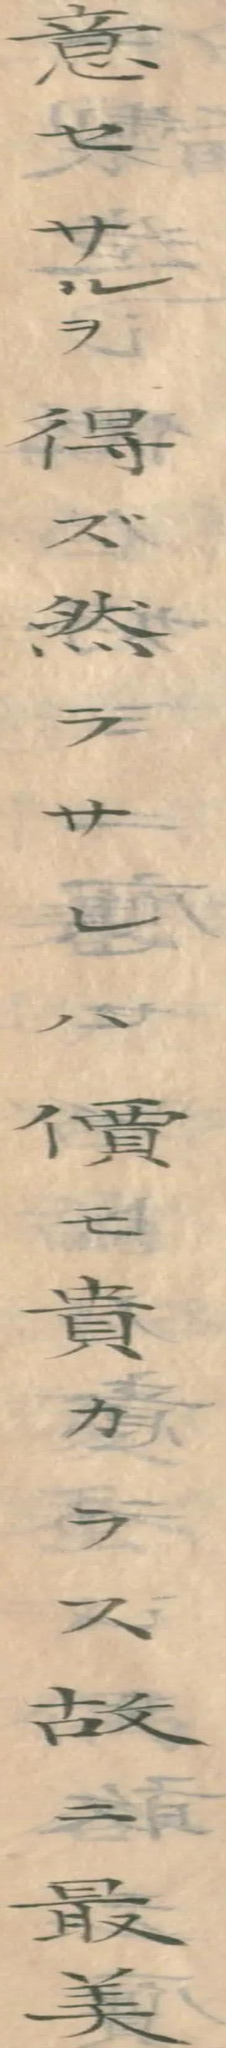意セサルヲ得ズ然ラサレハ価モ貴カラス故ニ最美

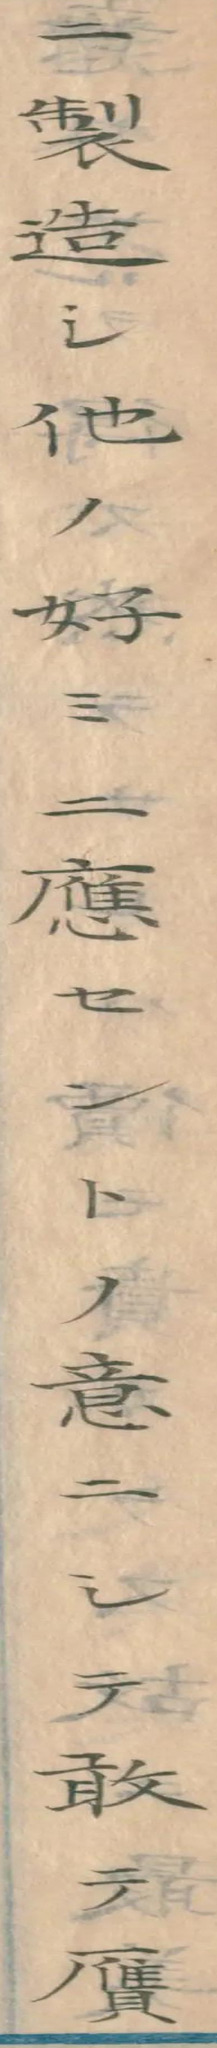ニ製造シ他ノ好ミニ応セントノ意ニシテ敢テ贋
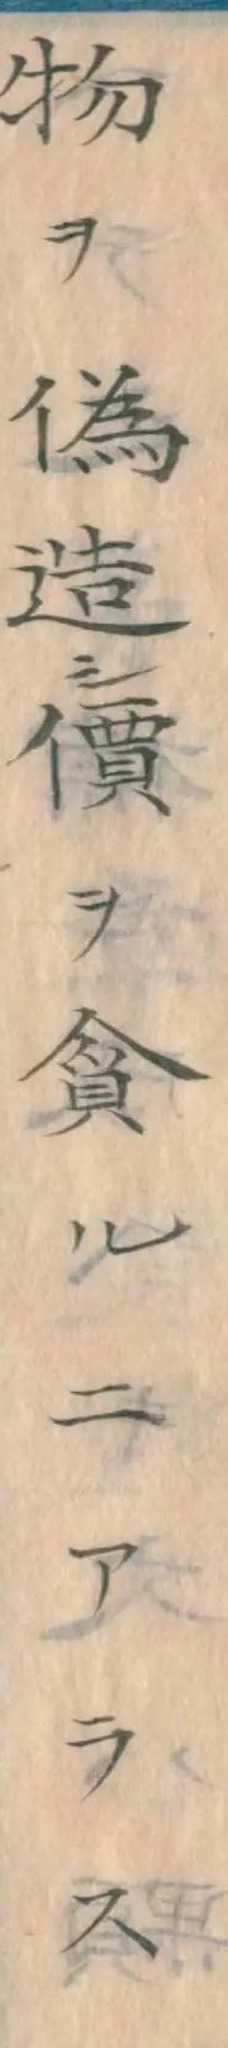物ヲ偽造シ価ヲ貪ルニアラス
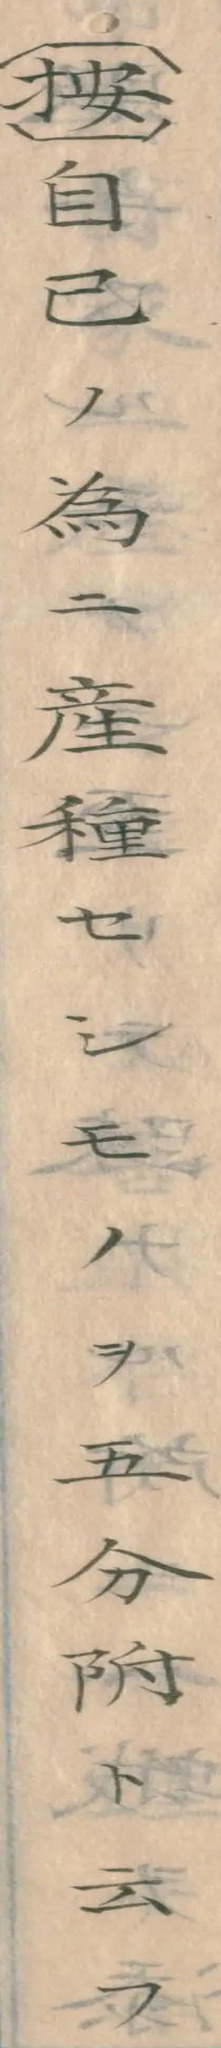[按]自己ノ為ニ産種セシモノヲ五分附ト云フ
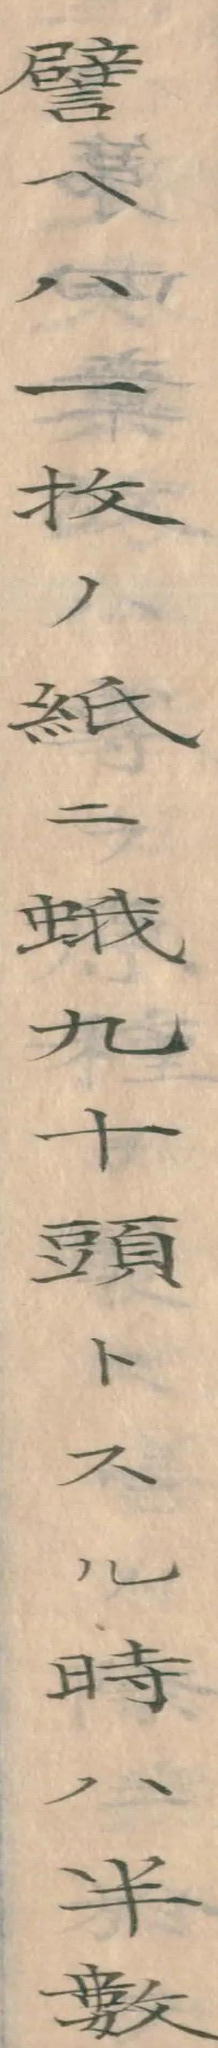譬ヘハ一枚ノ紙ニ蛾九十頭トスル時ハ半数
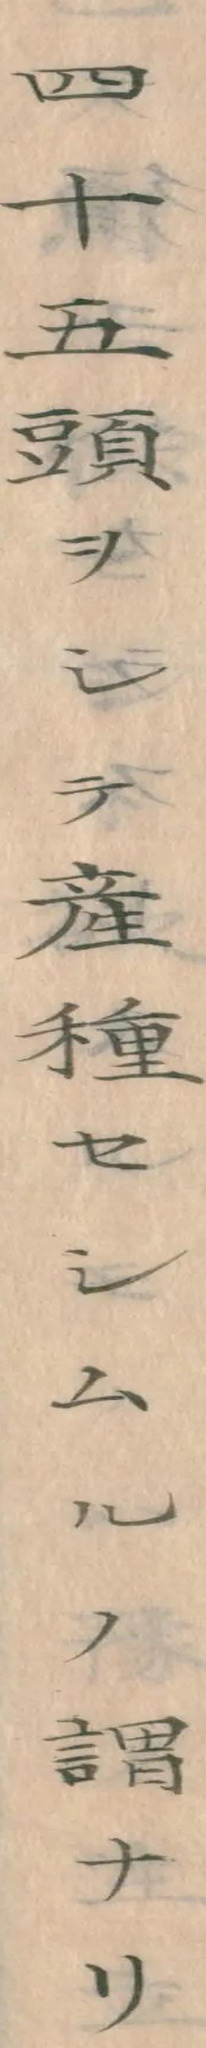四十五頭ヲシテ産種セシムルノ謂ナリ
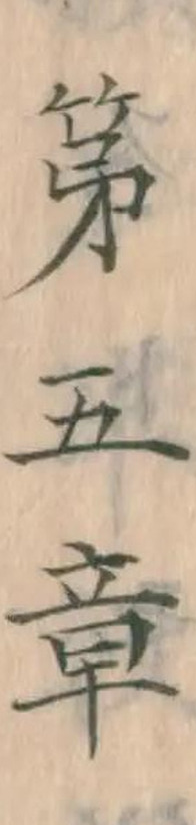第五章
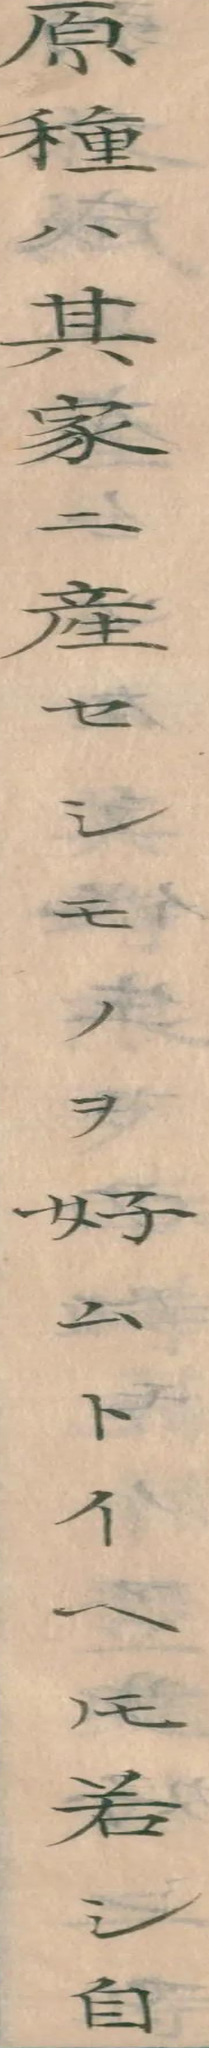原種ハ其家ニ産セシモノヲ好ムトイヘトモ若シ自
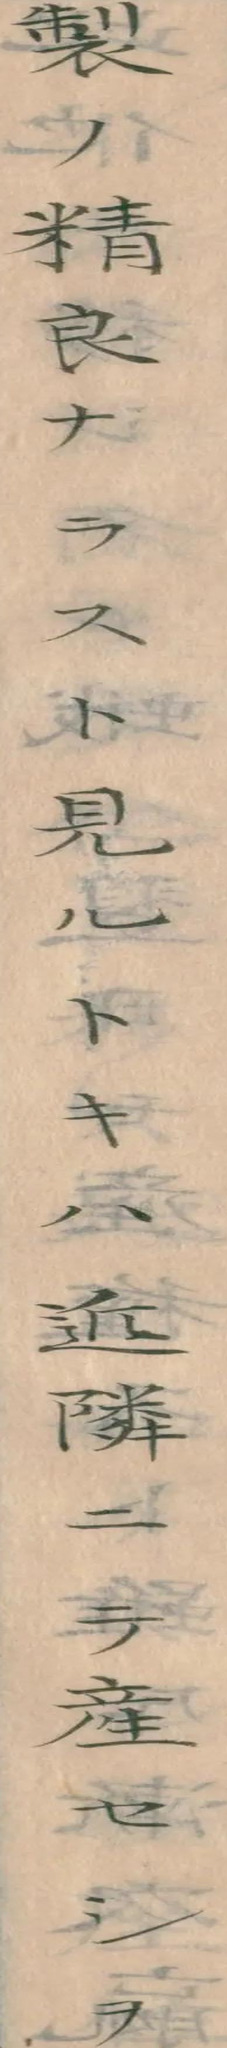製ノ精良ナラスト見ルトキハ近隣ニテ産セシヲ
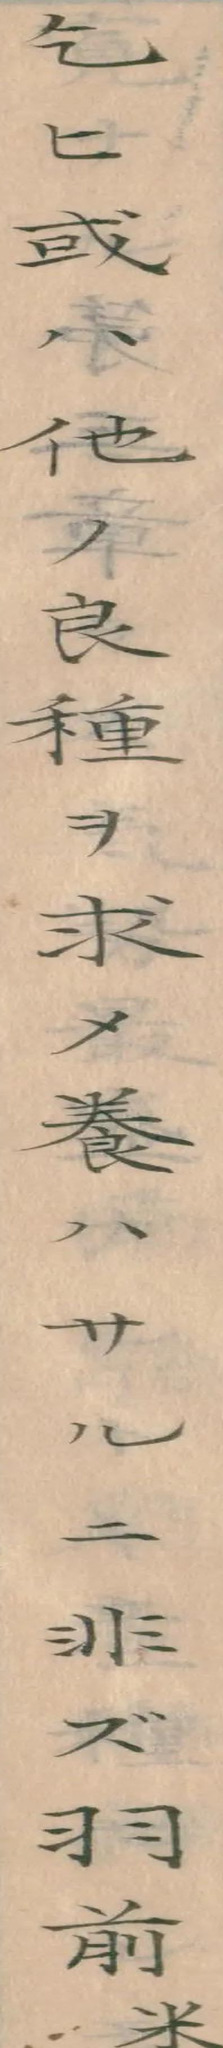乞ヒ或ハ他ノ良種ヲ求メ養ハサルニ非ズ羽前米
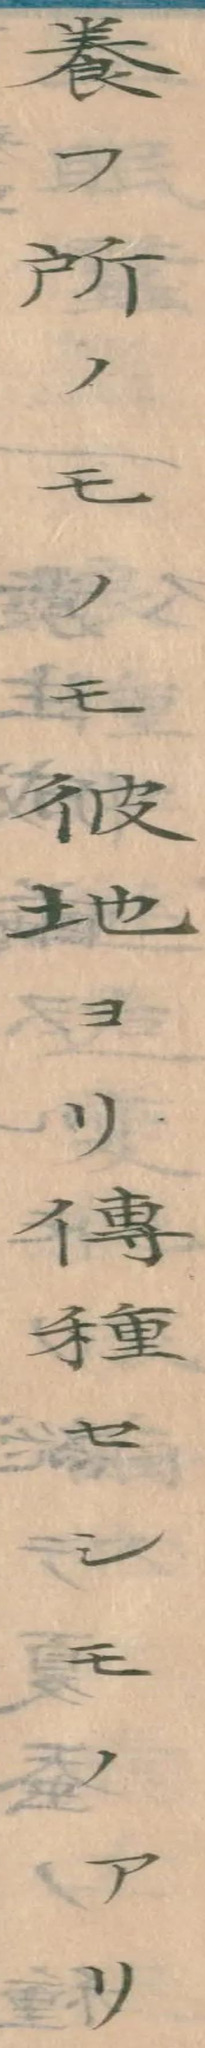養フ所ノモノモ彼地ヨリ伝種セシモノアリ
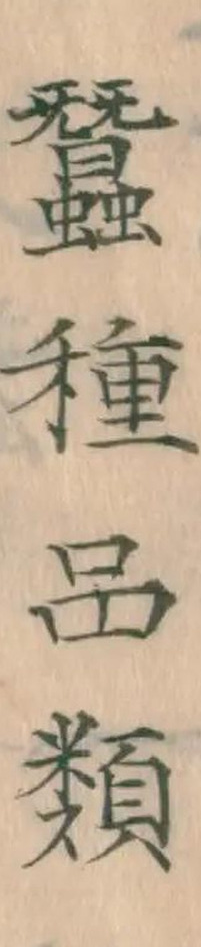蚕種品類
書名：蚕桑集成
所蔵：国立国会図書館 National Diet Library, JAPAN
